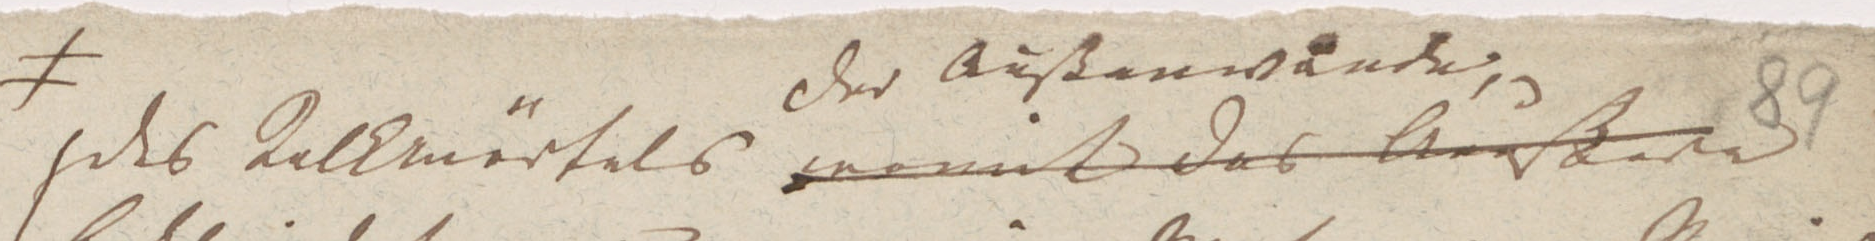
% des Kalkmörtels womit das Assere der
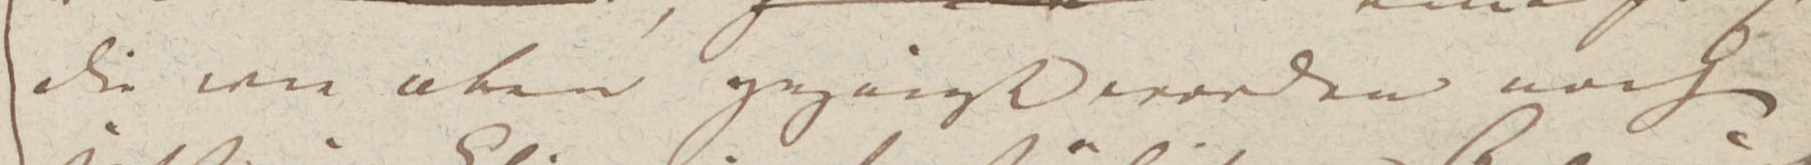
die wie oben gezeigt worden noch
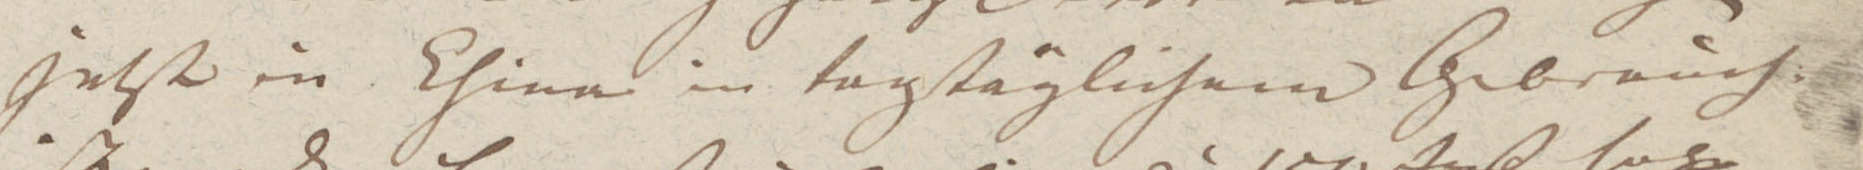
jetzt in China in tagtäglichem Gebrauch
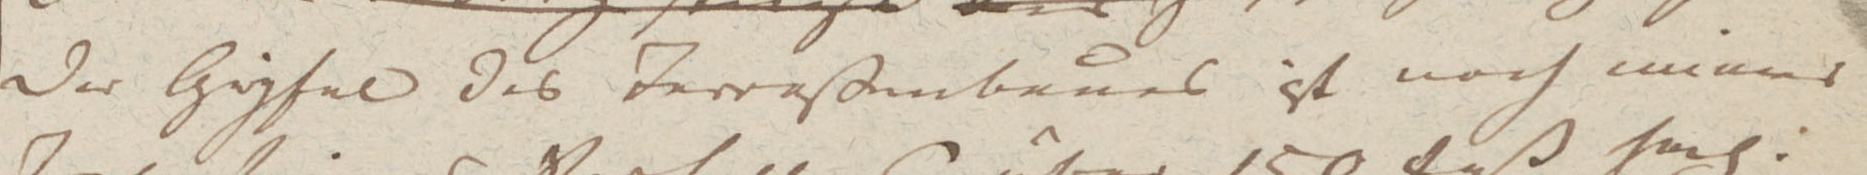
Der Gipfel des Terrassenbaues ist noch immer
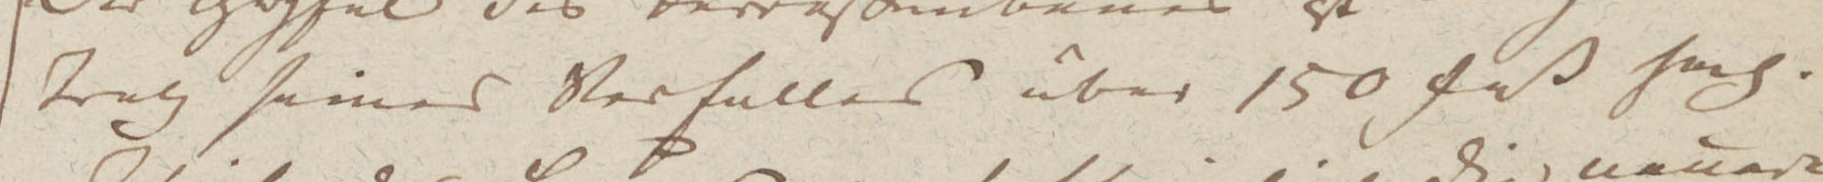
trotz seines Verfalles über 150 Fuss hoch.
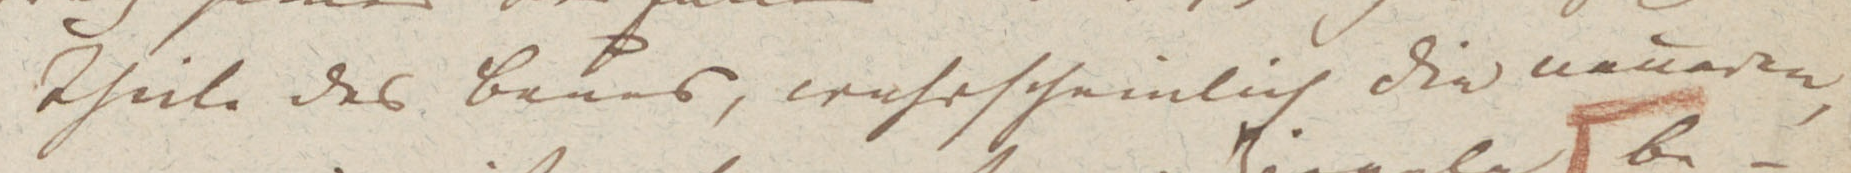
Theile des Baues, wahrscheinlich die neueren,
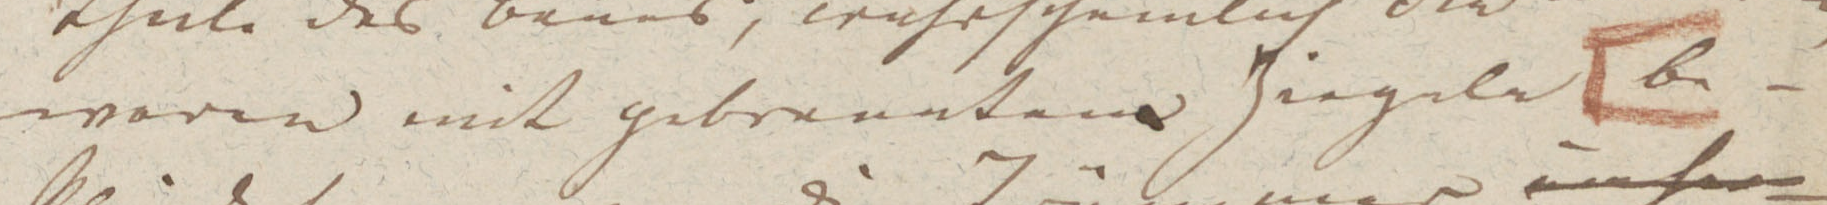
waren mit gebranntemn Ziegeln % be-
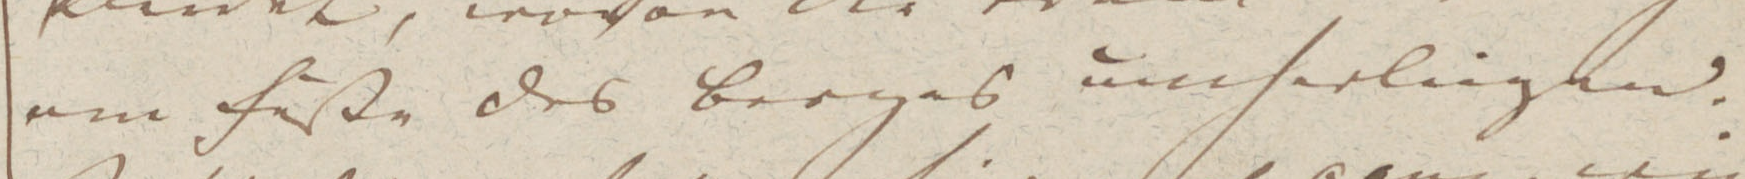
am Fusse des Berges umherliegen.
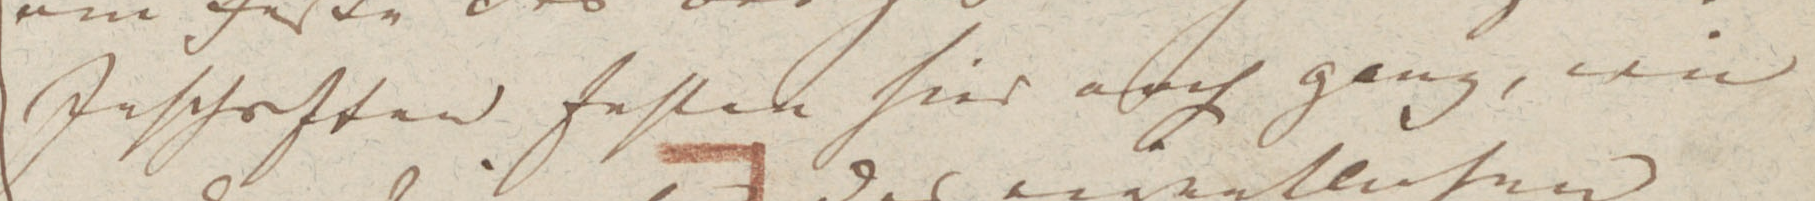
Inschriften fehlen hier noch ganz, wie
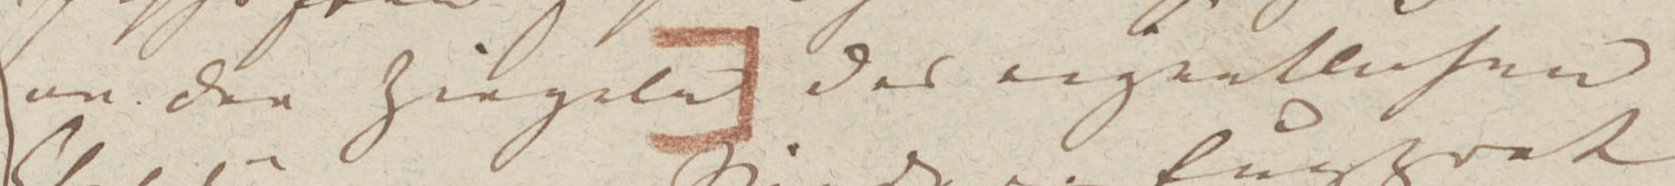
an den Ziegeln % des eigentlichen
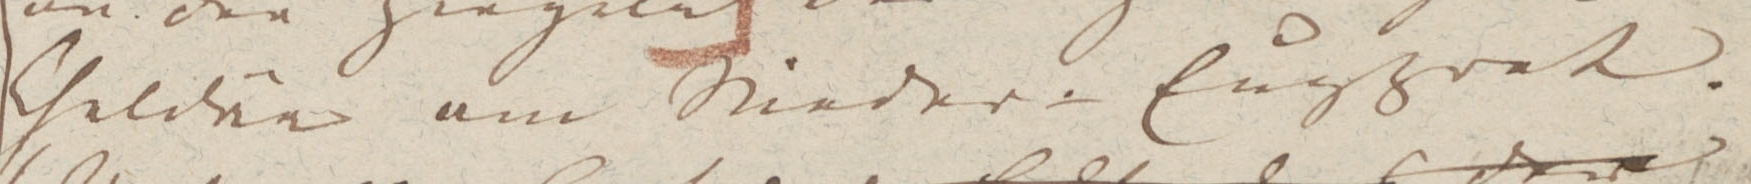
Chaldäa am Nieder-Euphrat.
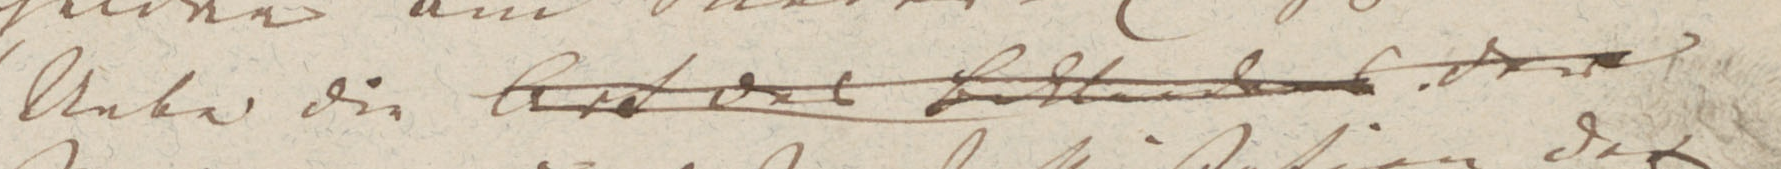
Uebe die Art des Bekleidens der
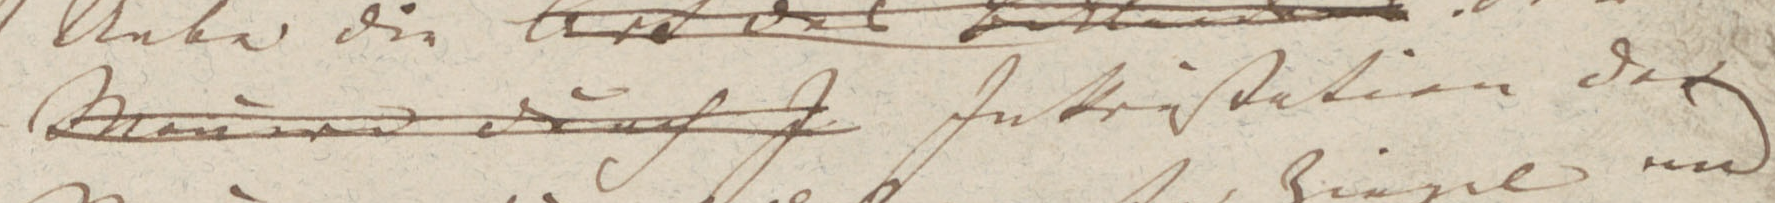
Mauern durch I Inkrustation der
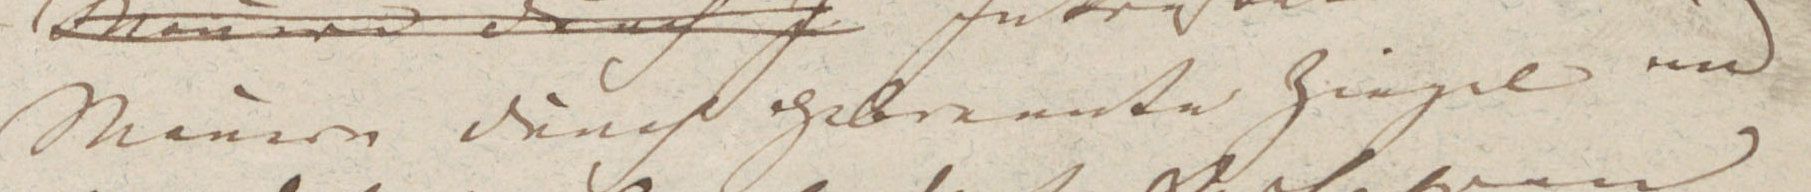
Mauern durch gebrannte Ziegel und
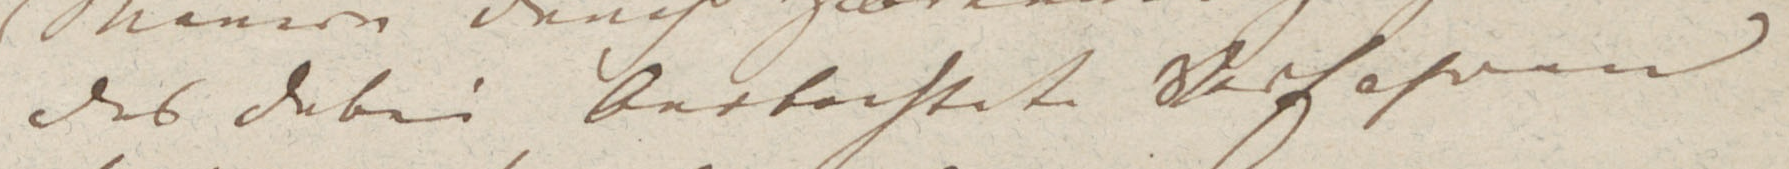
das dabei beobachtete Verfahren
